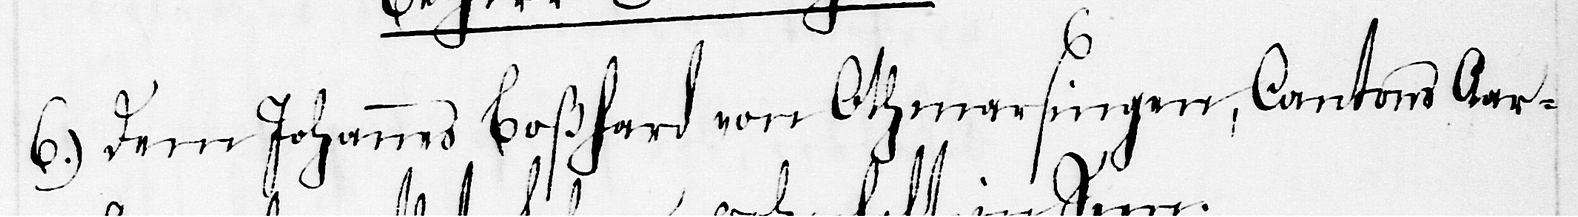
6.) Dem Johannes Boßhard von Othmarsingen, Cantons Aar¬
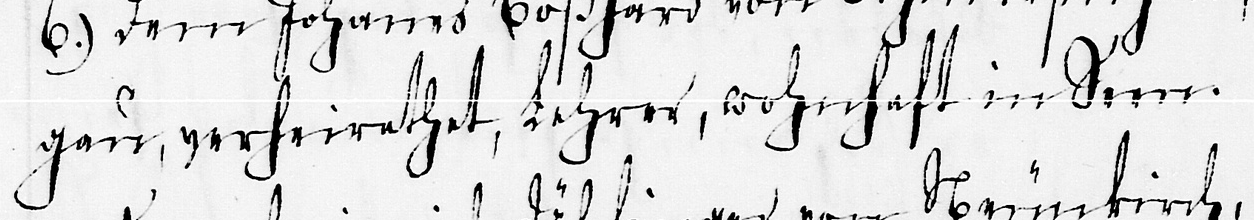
gau, verheirathet, Lehrer, wohnhaft in Seen.
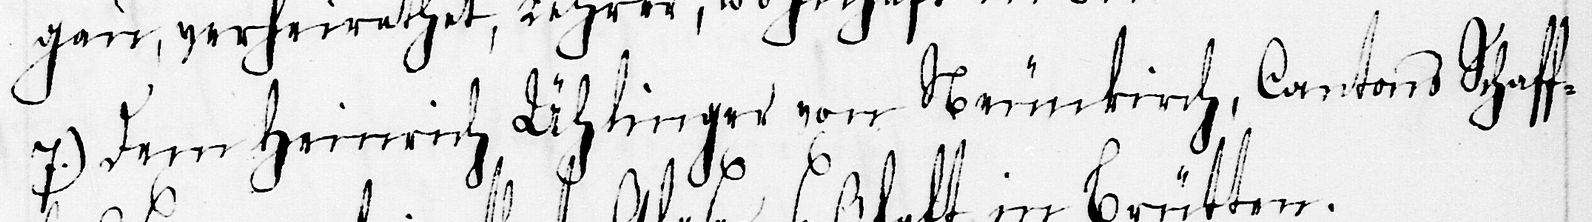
7.) Dem Heinrich Ühlinger von Neunkirch, Cantons Schaf¬
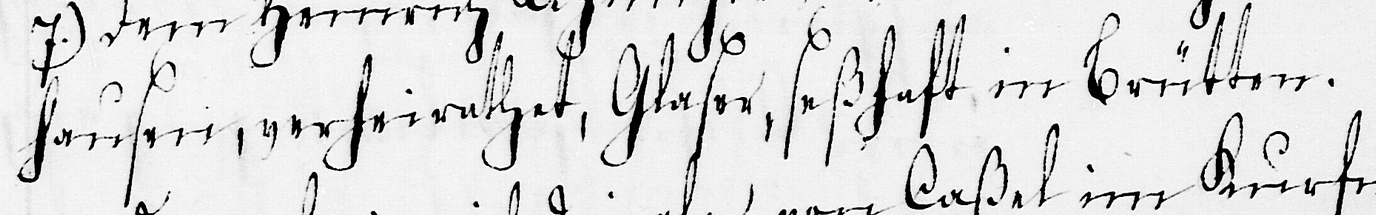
fhausen, verheirathet, Glaser, seßhaft in Brütten.
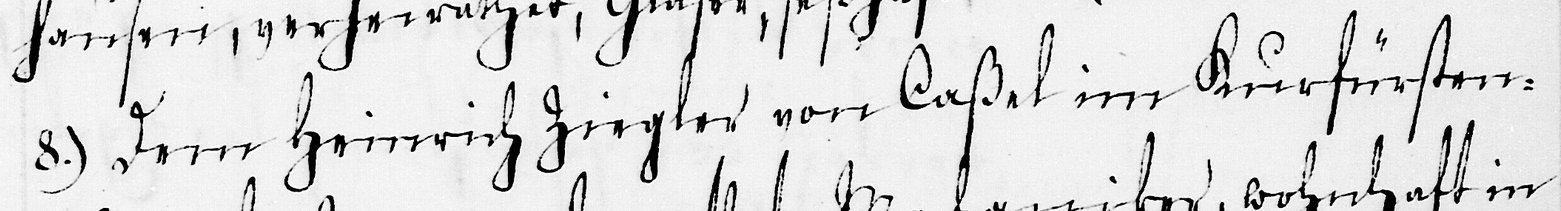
8.) Dem Heinrich Ziegler von Caßel im Kurfürsten¬
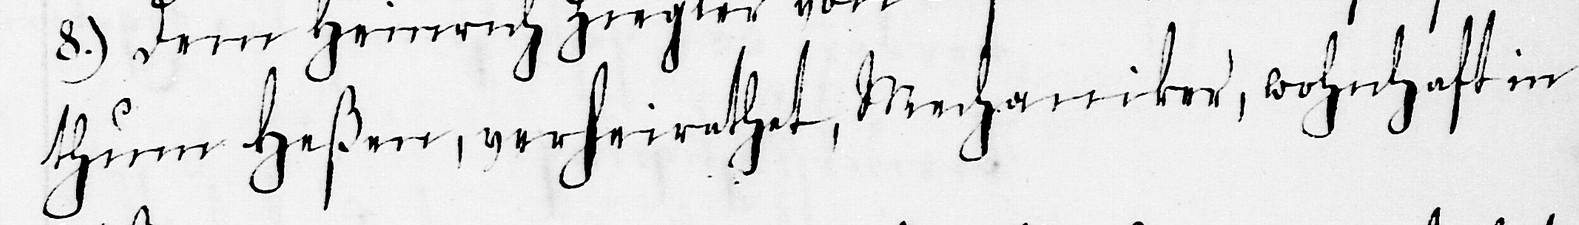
thum Heßen, verheirathet, Mechaniker, wohnhaft in
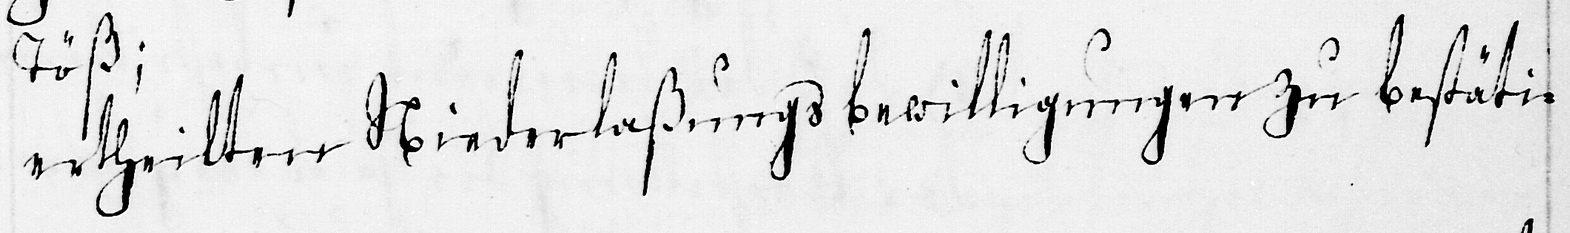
ertheilten Niederlaßungsbewilligungen zu bestäti¬
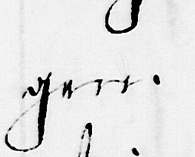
gen.
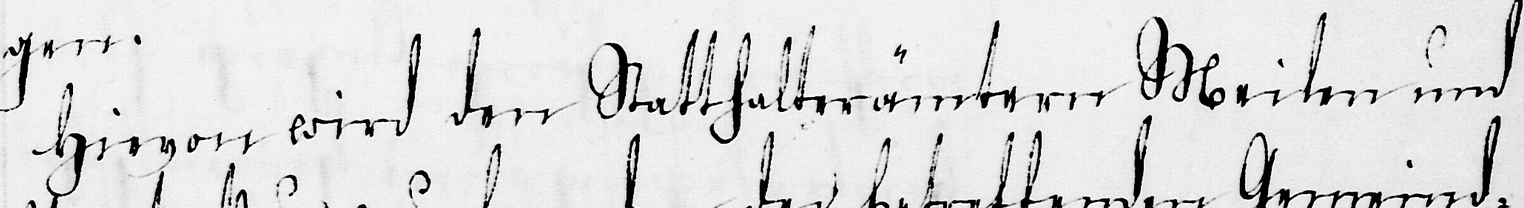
Hievon wird den Statthalterämtern Meilen und
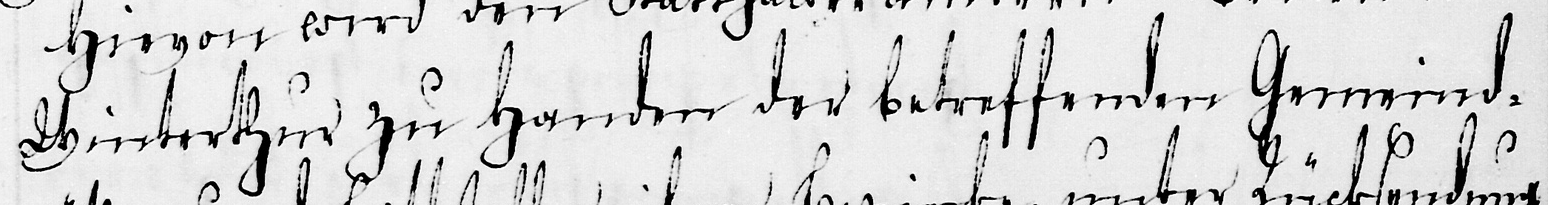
Winterthur zu Handen der betreffenden Gemeind¬
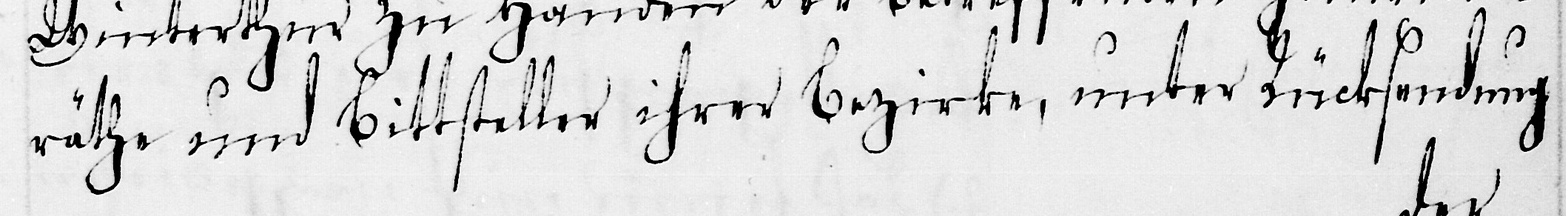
räthe und Bittsteller ihrer Bezirke, unter Rücksendung
